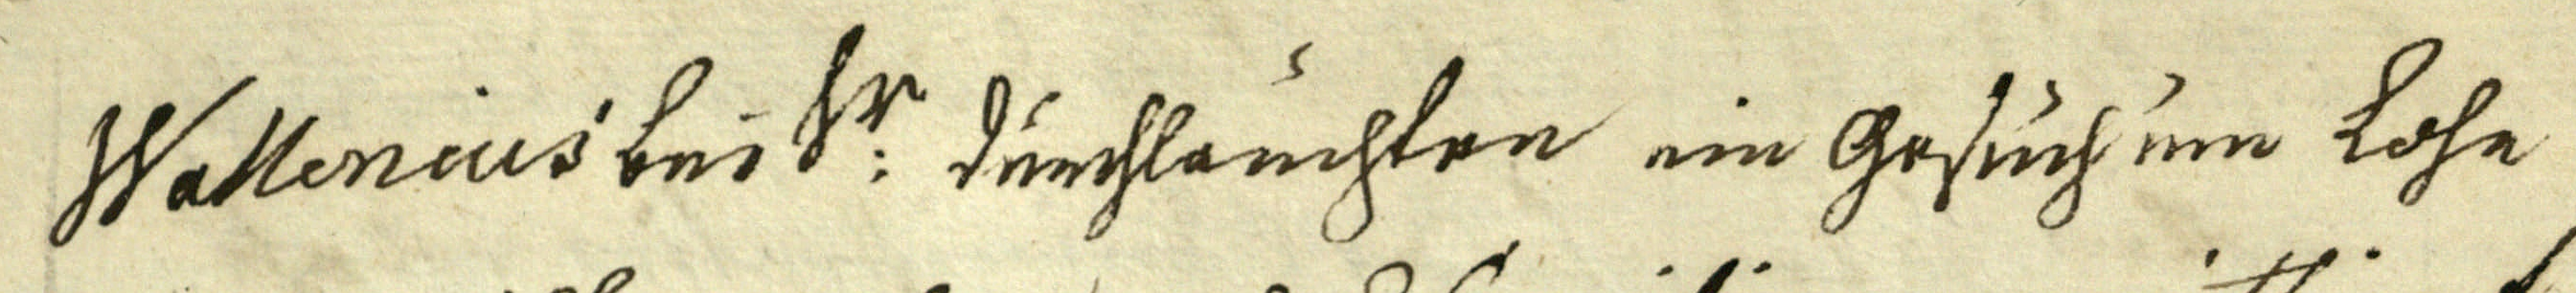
Wallenius bei Sr. Durchlauchten ein Gesuch um Lohn
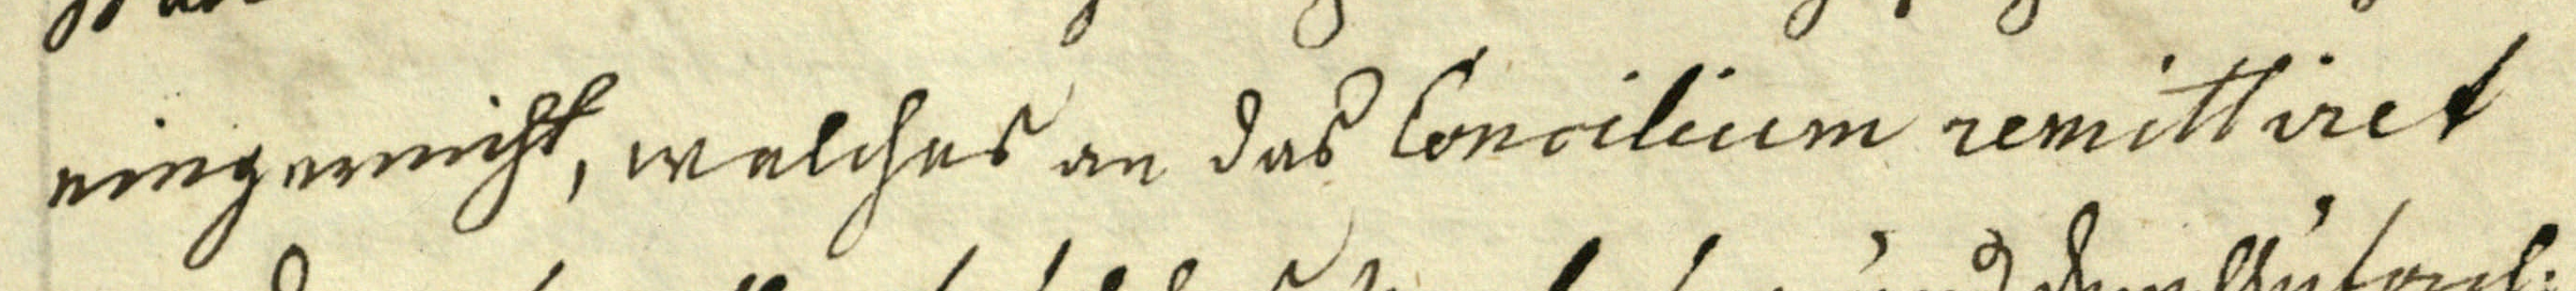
eingereicht, welches an das Concilium remittiret
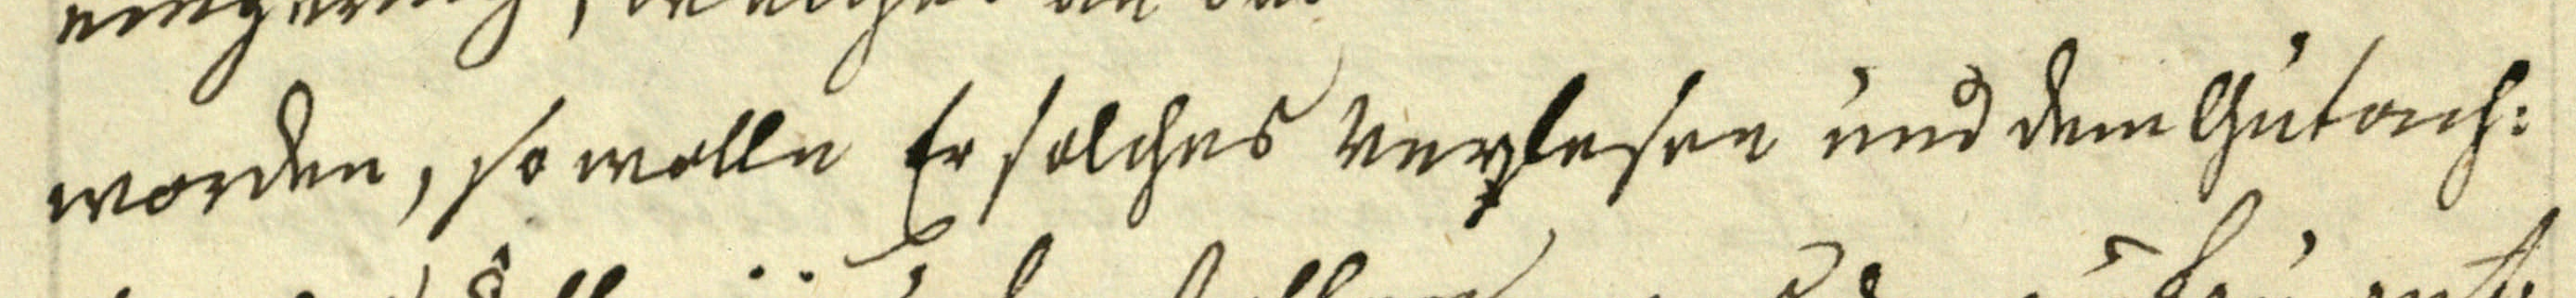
worden, so wolle Er solches verlesen und dem Gutach¬
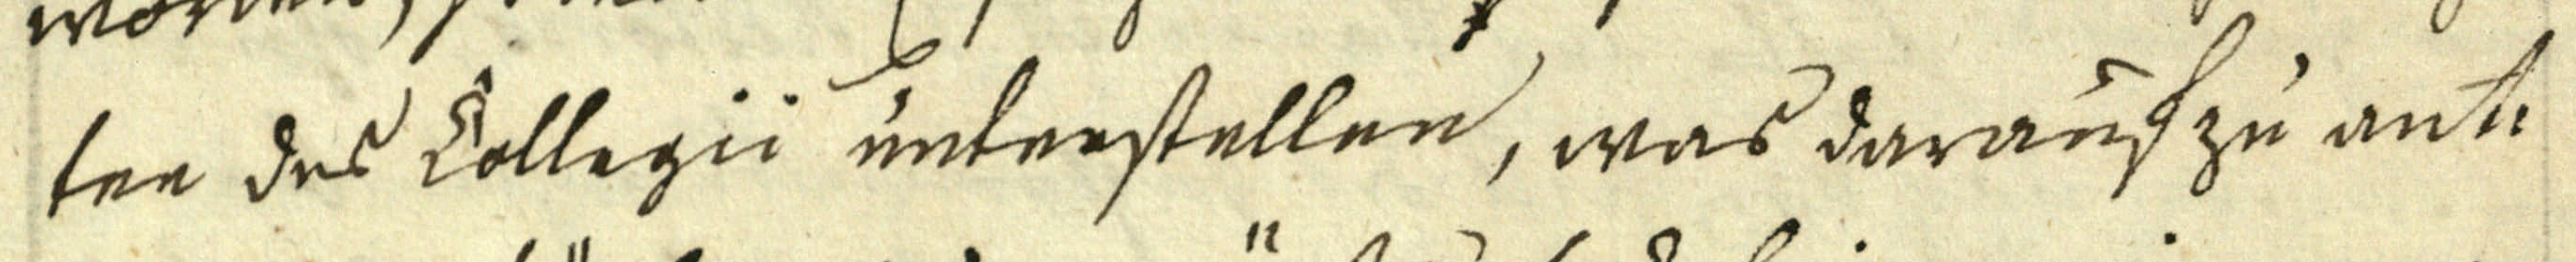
ten des Collegii unterstellen, was darauf zu ant¬
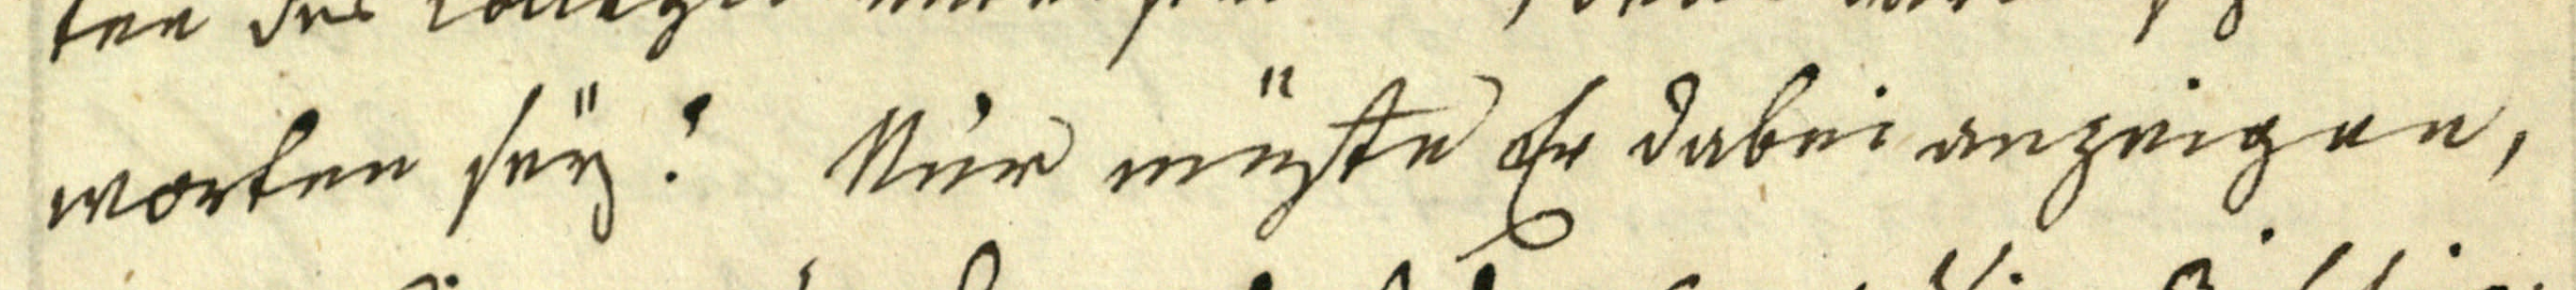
worden seÿ? Nun müste Er dabei anzeigen,
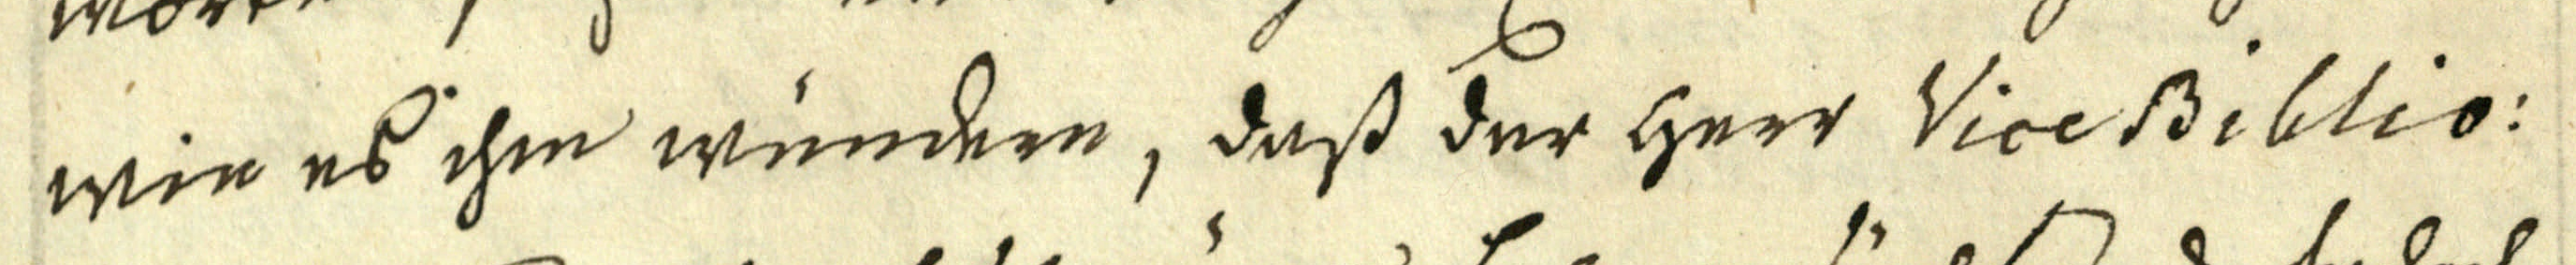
wie es ihm wundere, daß der Herr ViceBiblio¬
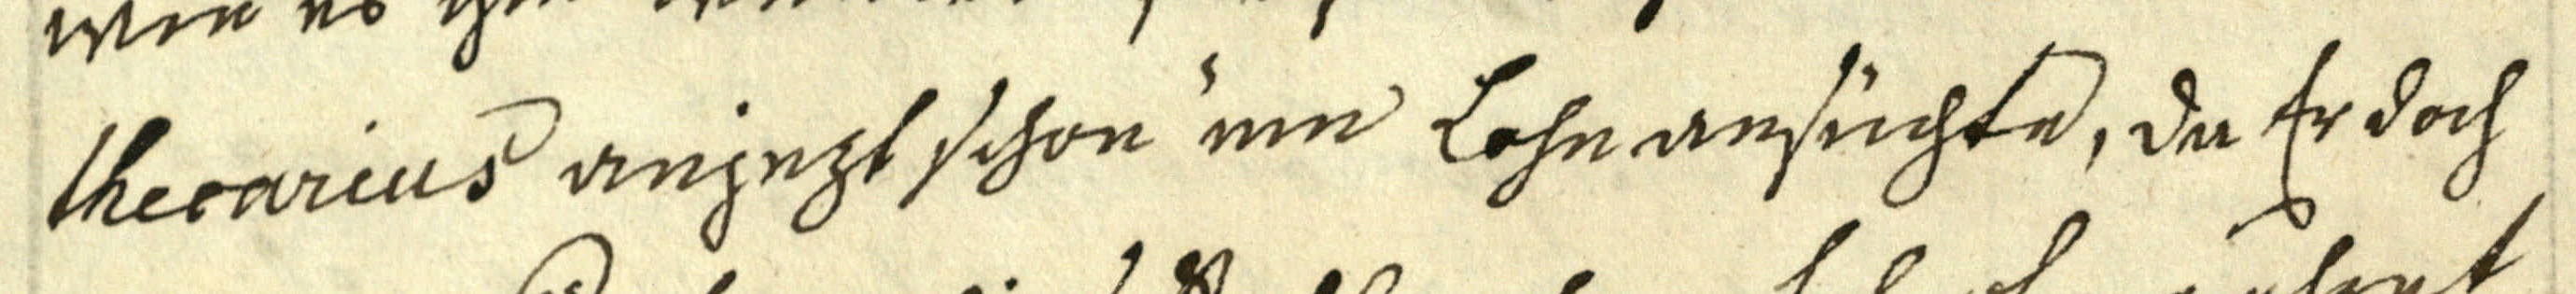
thecarius anjezt schon um Lohn ansuchte, da Er doch
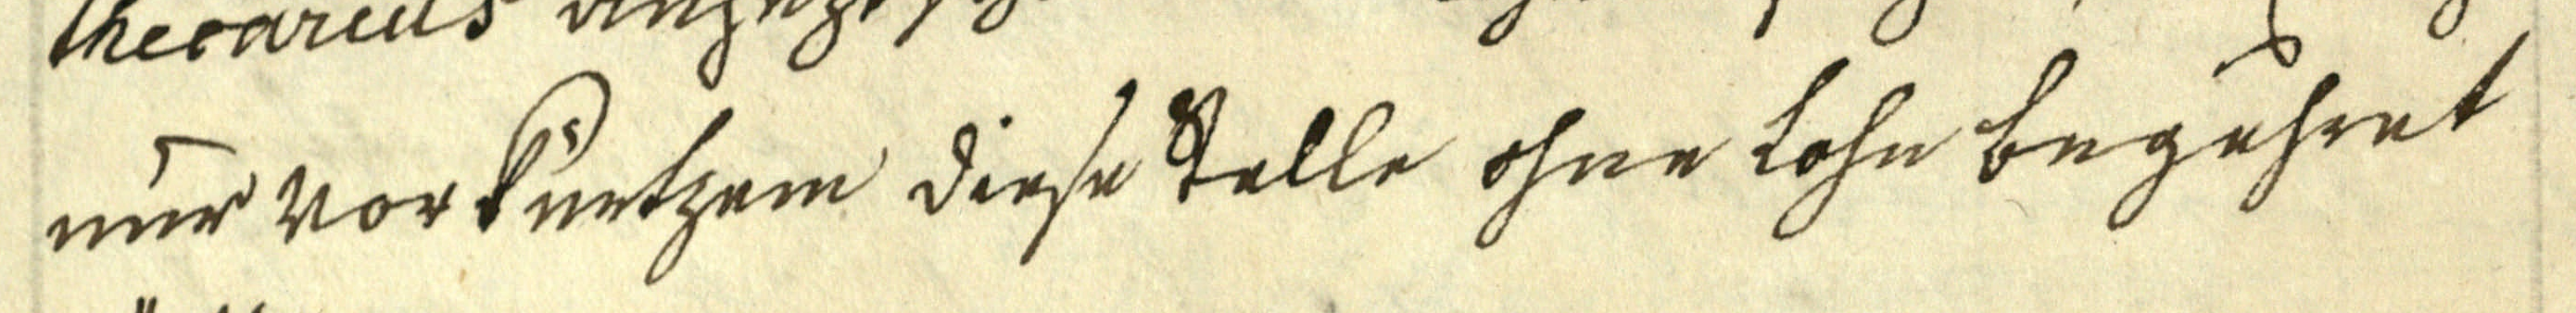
nur vor kurtzem diese Stelle ohne Lohn begehret
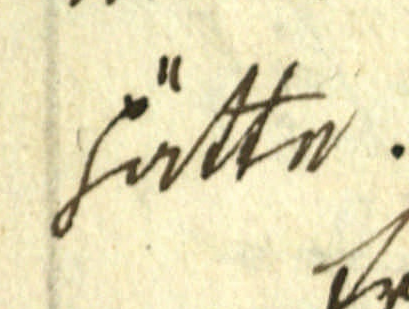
hätte
